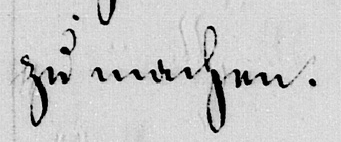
zu machen.
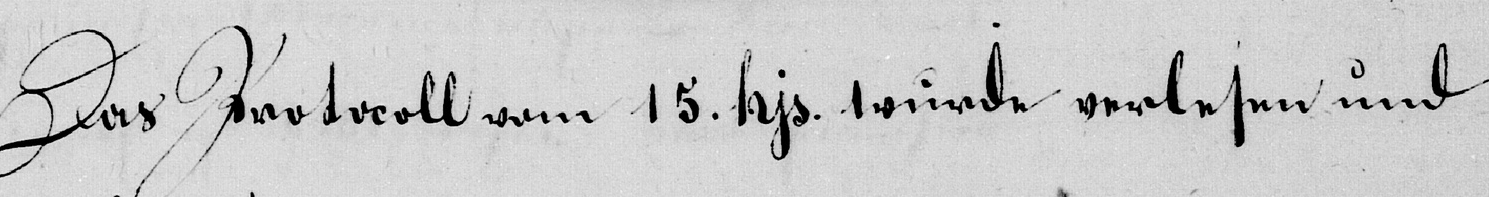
Das Protocoll vom 15. hjs. wurde verlesen und
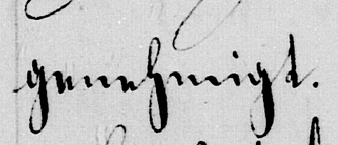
genehmigt.
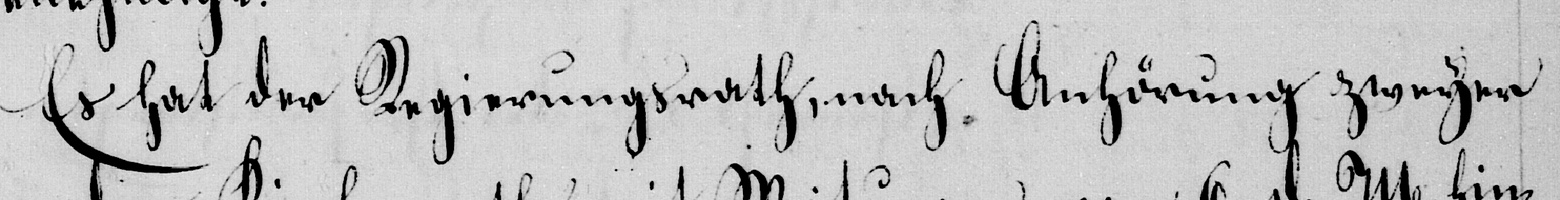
Es hat der Regierungsrath, nach Anhörung zweyer
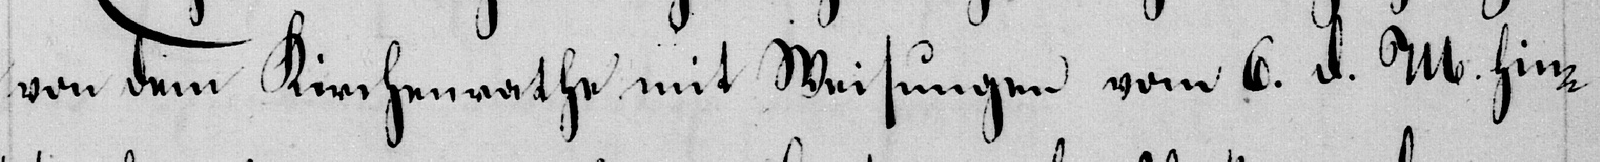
von dem Kirchenrathe mit Weisung vom 6. d. M. hin¬
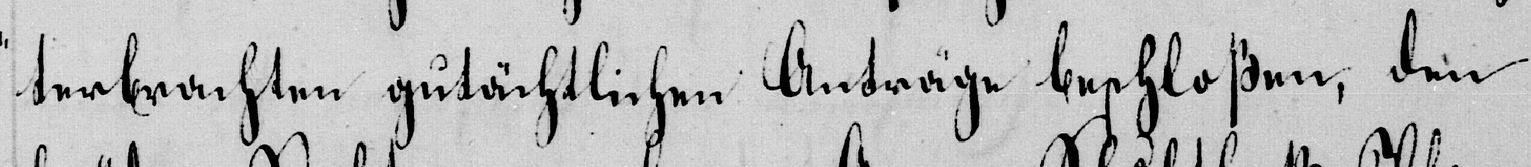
terbrachten gutächtlichen Anträge beschloßen, den
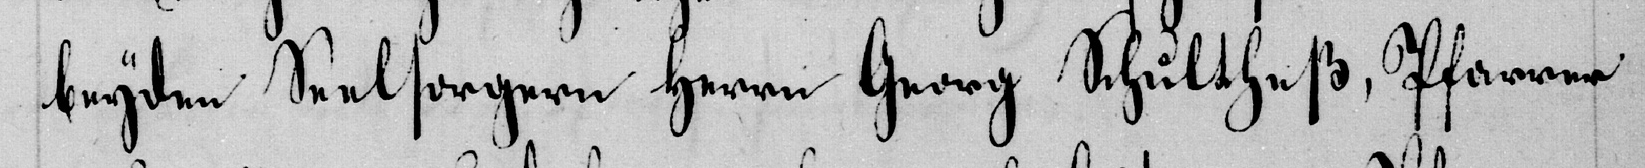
beyden Seelsorgern Herrn Georg Schultheß, Pfarrer
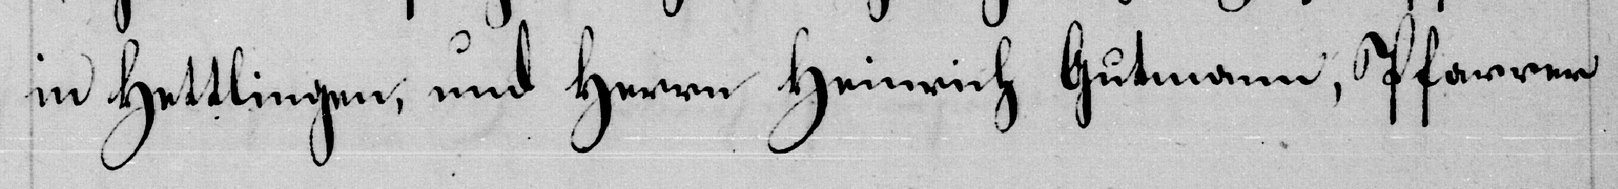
in Hettlingen, und Herrn Heinrich Gutmann, Pfarrer
